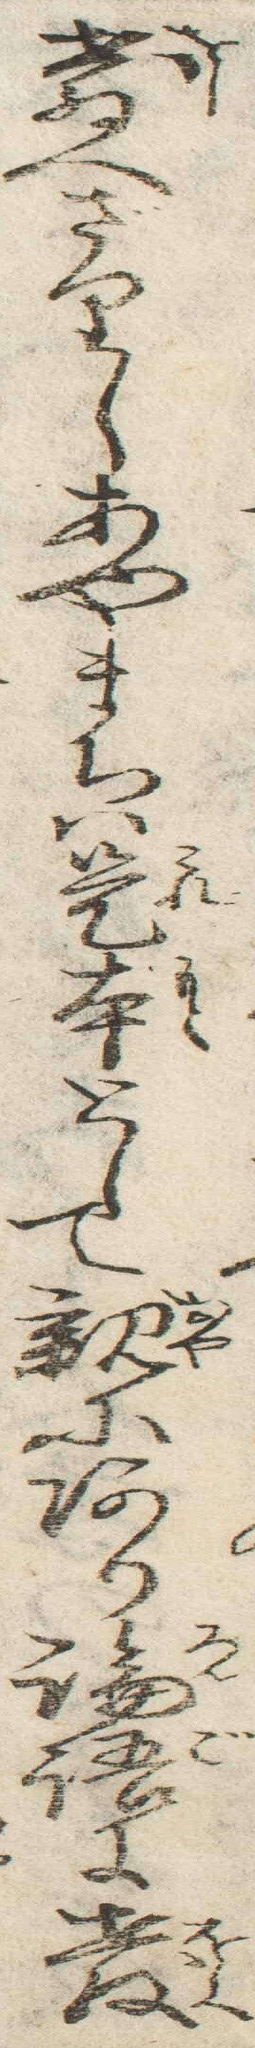教へざりしあやまちは是本として親にあり論語に教
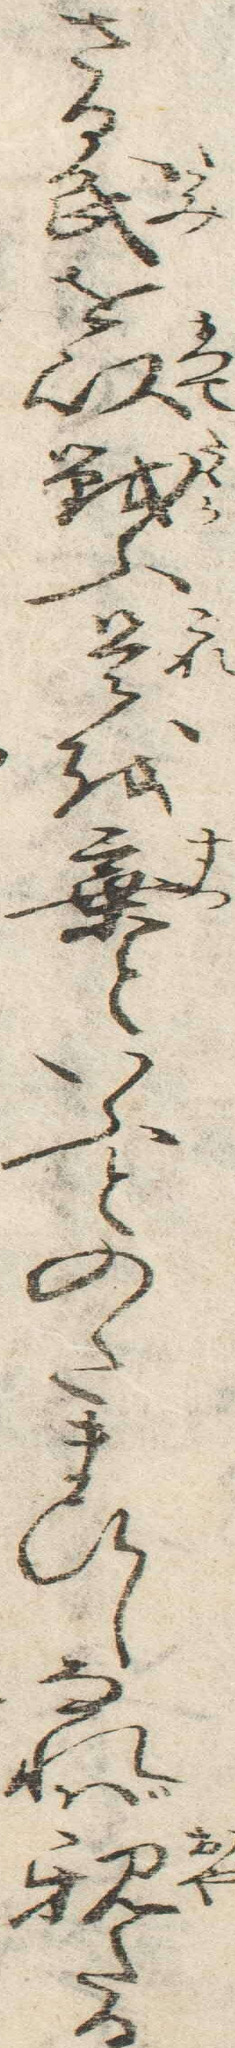さる民を以戦ふ是を棄といふとのたまひしなれば親たる
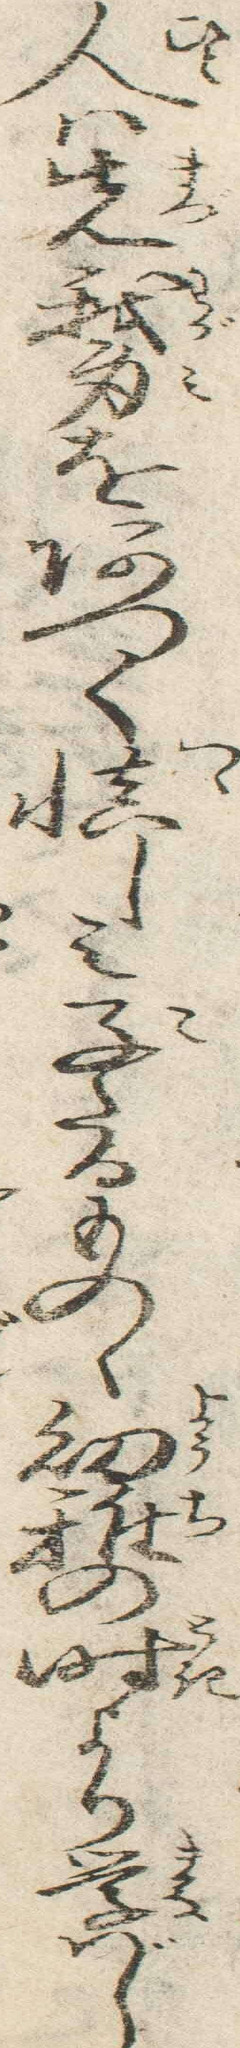人は先我身をあつく慎しみ子たるものゝ幼稚の時より学ばし
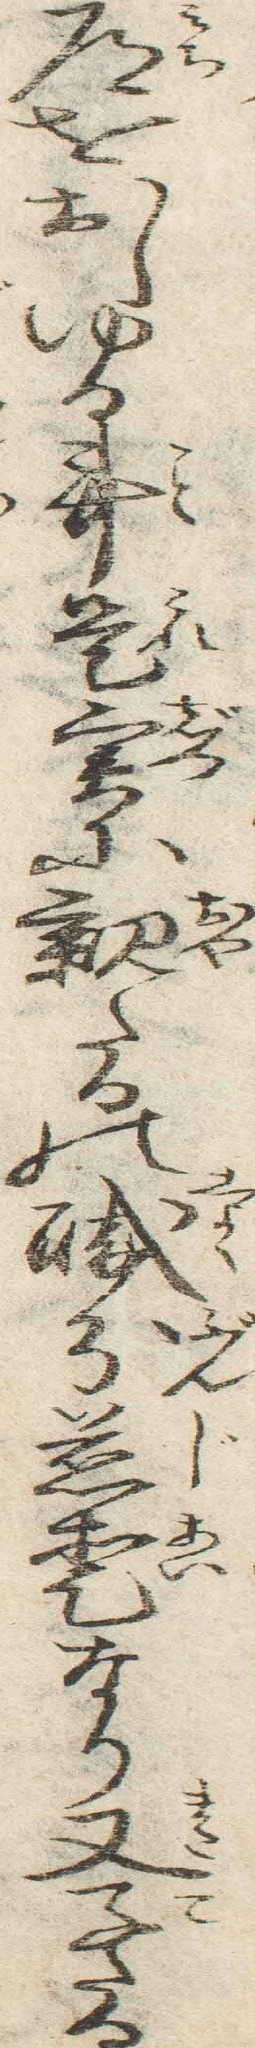道をおしゆる事是実に親たるの職分慈愛なり又子たる
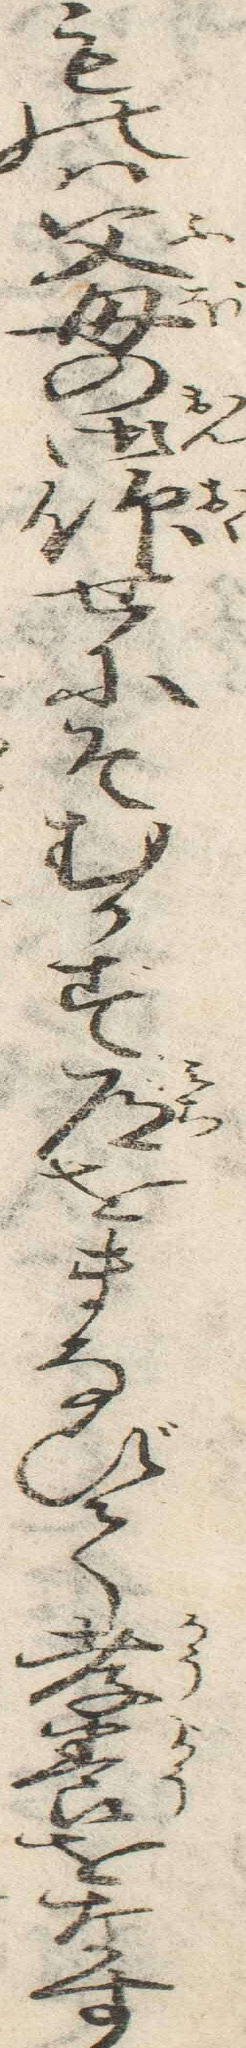ものは父母の御仰せにそむかす道をまなびて孝養をなす
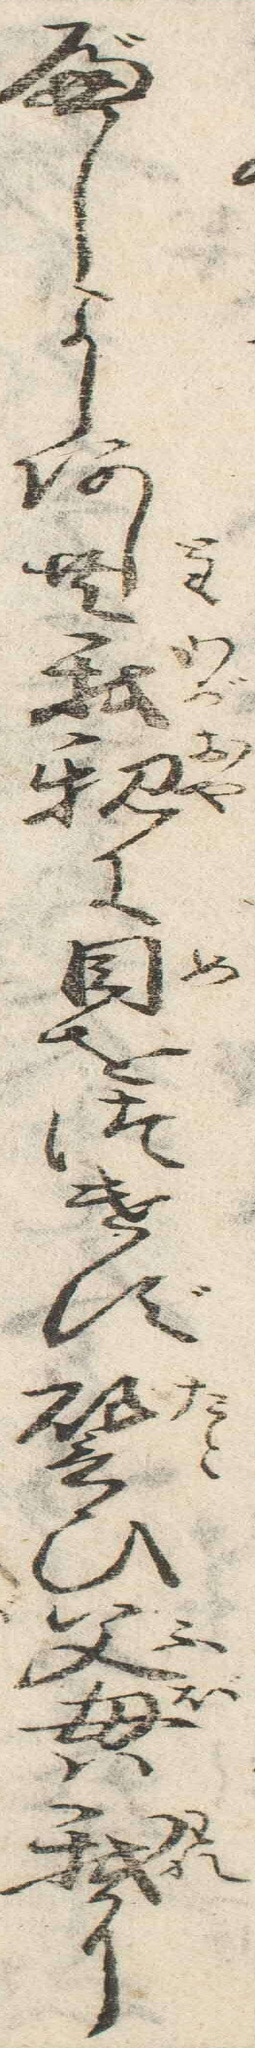べしよしあし共我親に目をつけず譬ひ父母は我に
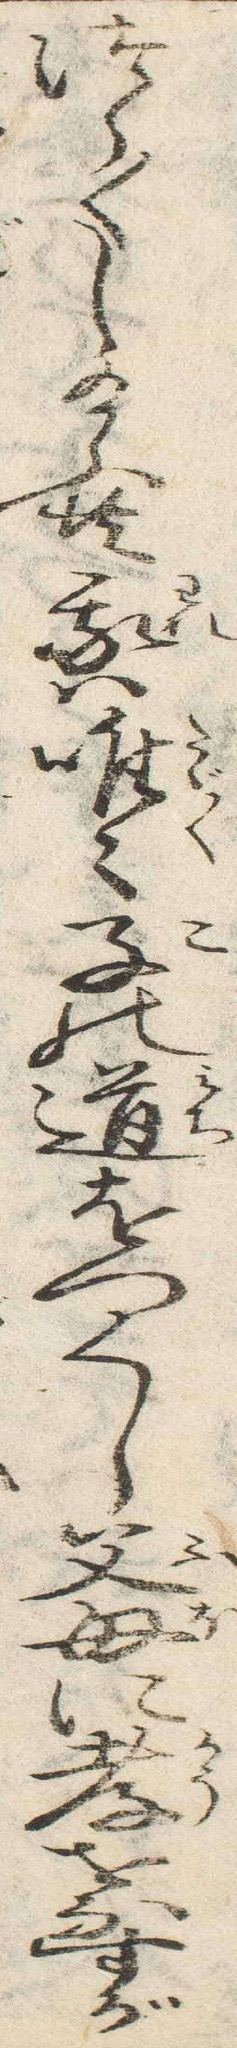つらくし給ふ共我は唯々子の道をつくし父母に孝をなすが
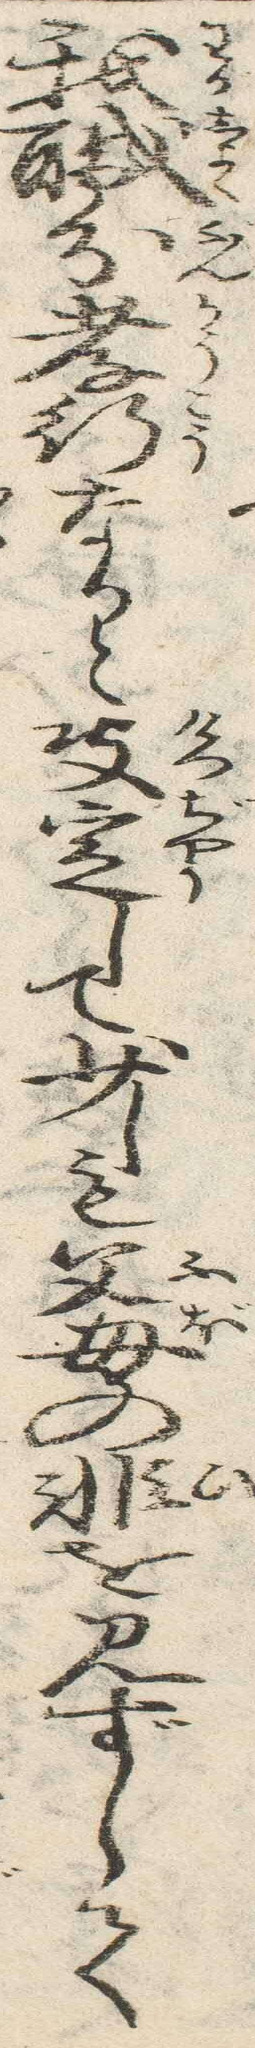我職分孝行なりと決定して少しも父母の非を見ずして
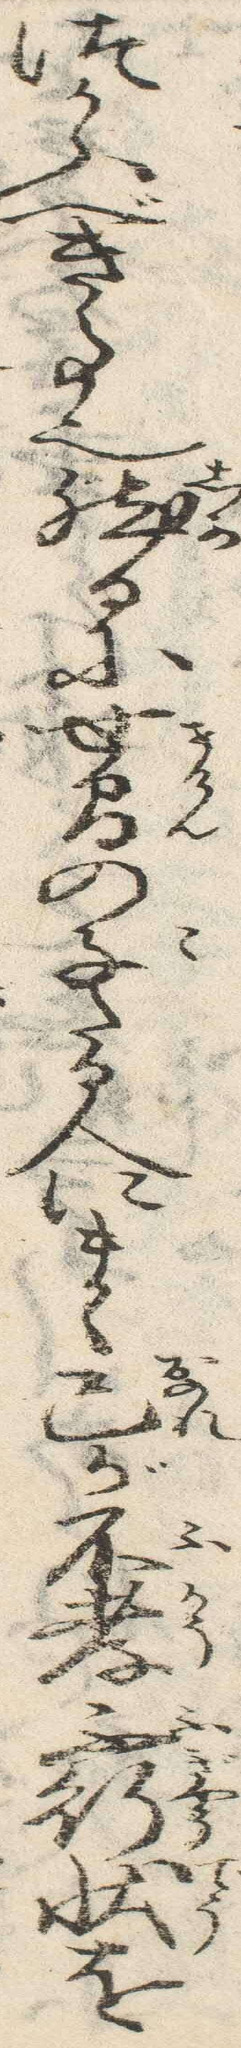つかふべき事也然るに世間の子たる人にまゝ己が不孝不行状を
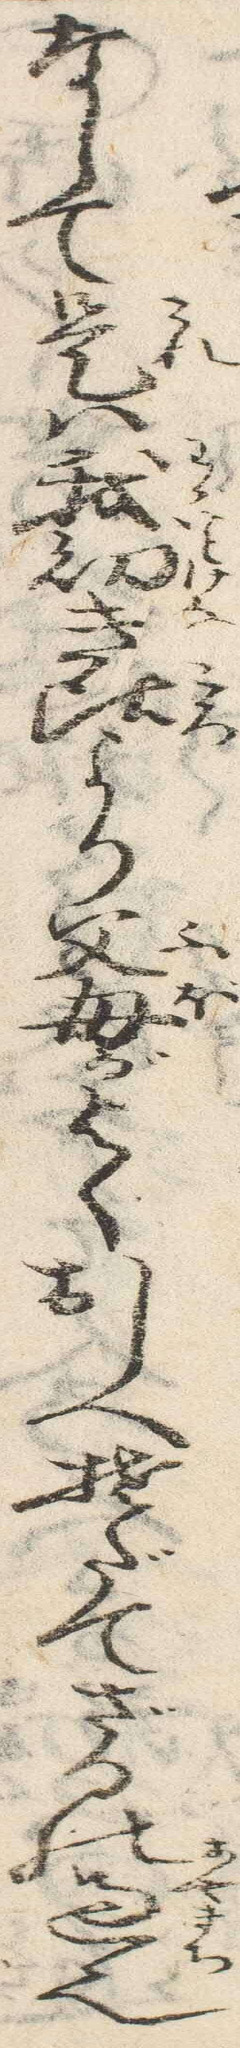なして是は我幼き比より父母がよくおしへそだてざるの過也
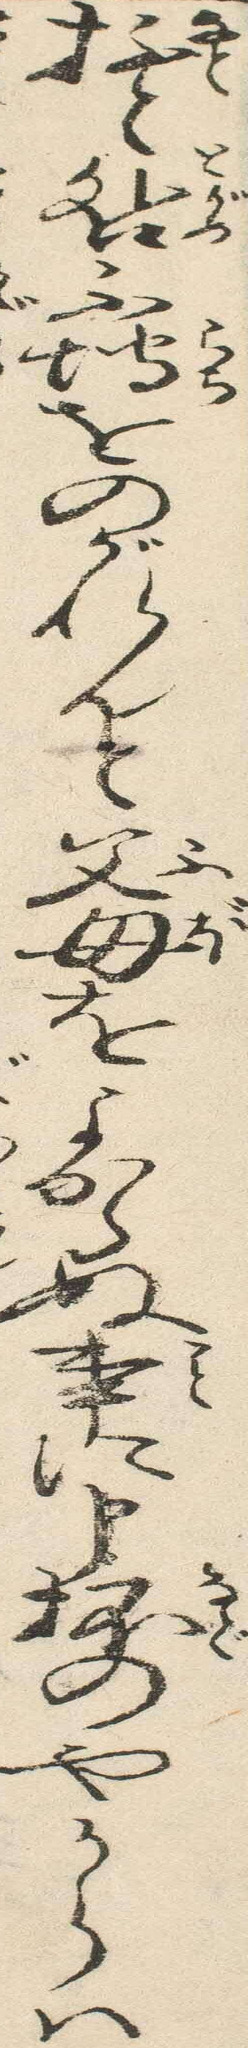抔と咎不埒をのがれんと父母をよからぬ事に申抔のやからは
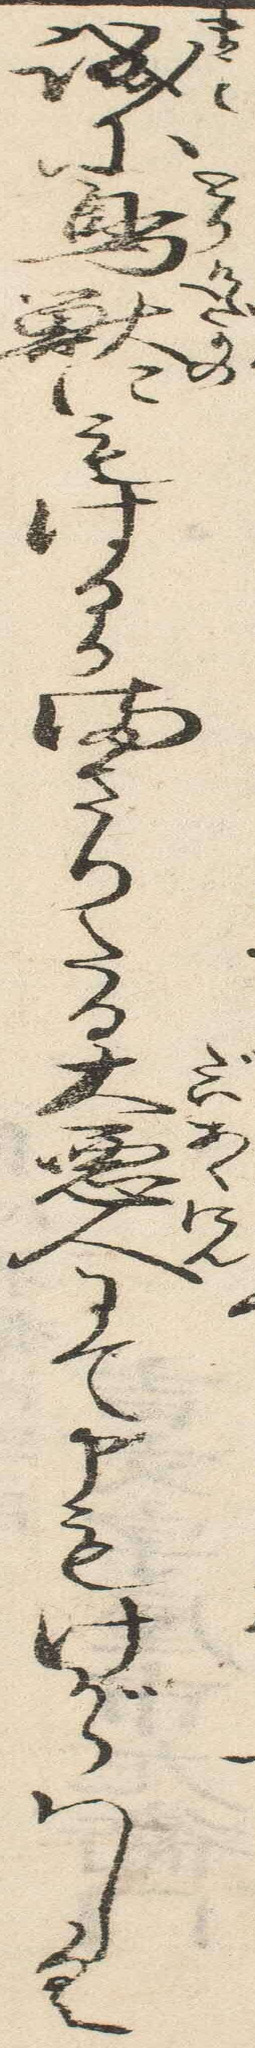誠に鳥獣にもはるかまさりたる大悪人にて申もけがらわしく
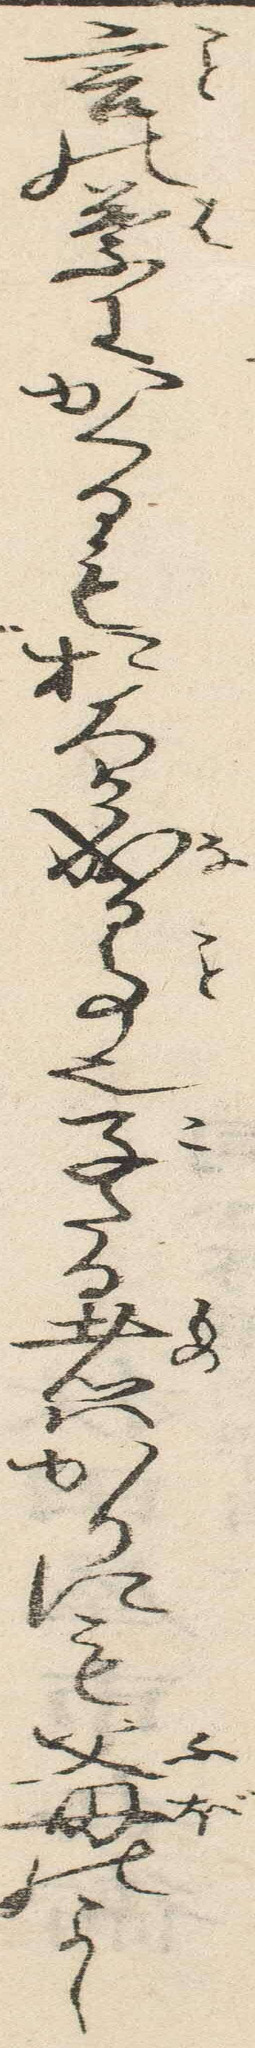言の葉にかくるもおろか成る事也子たる者はかりにも父母のよし
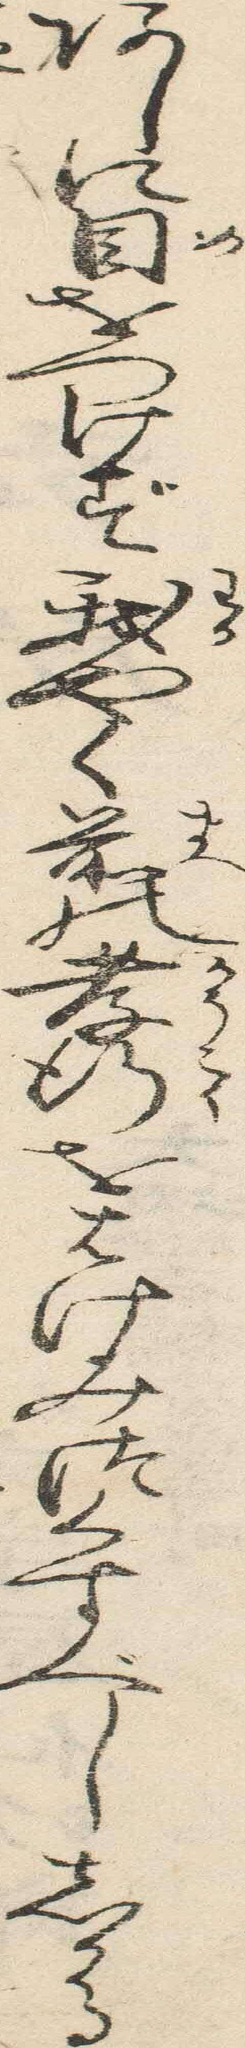あしに目をつけず我やく前の孝行をはけみつくすべししかる
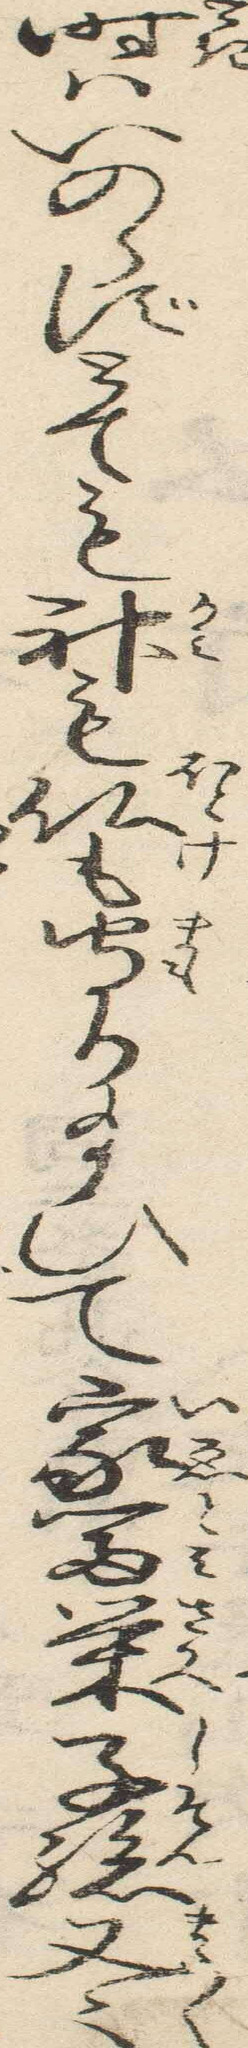時はいのらずとても神も仏も守り給ひて家富栄子孫又々
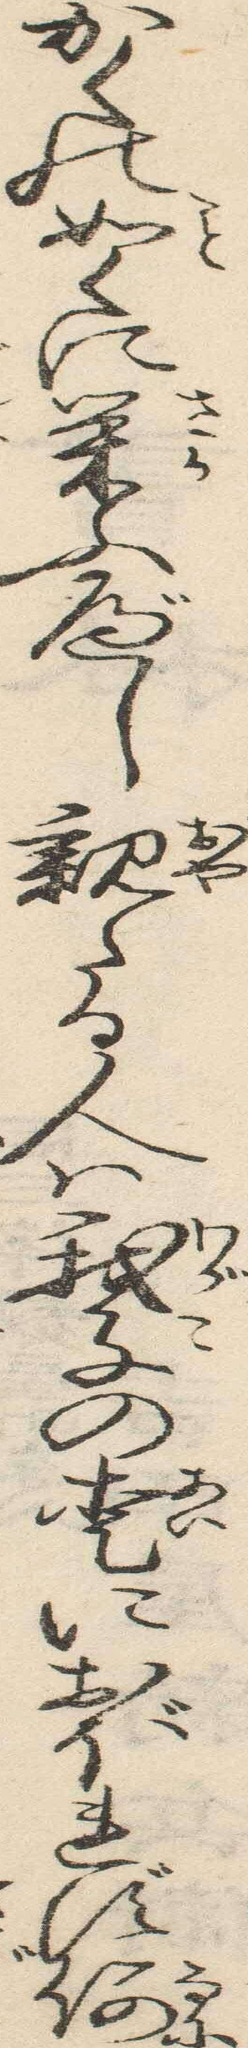かくの如くに栄ふべし親たる人は我子の愛におぼれず何
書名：撫育草
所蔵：東京学芸大学附属図書館 国文学研究資料館
